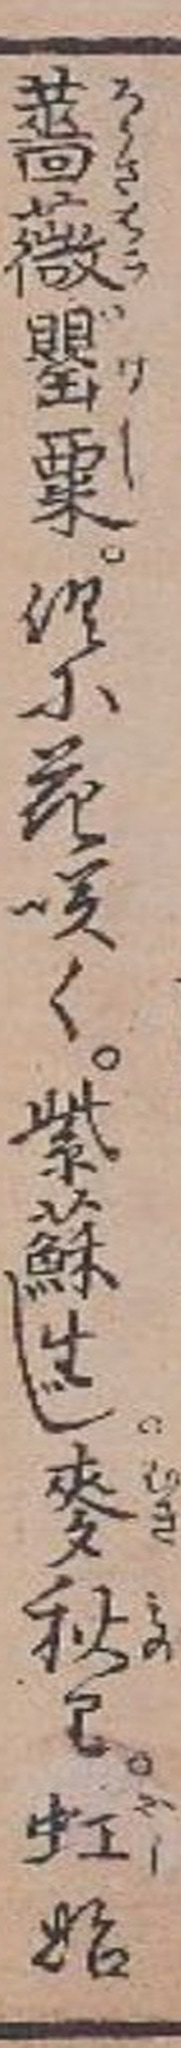薔薇、罌粟、俱に花咲く、紫蘇生じ、麦秋り、虹始
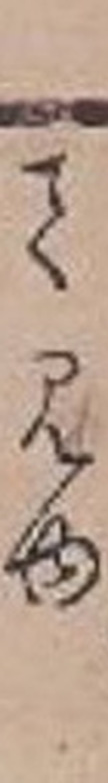て見ゆ、
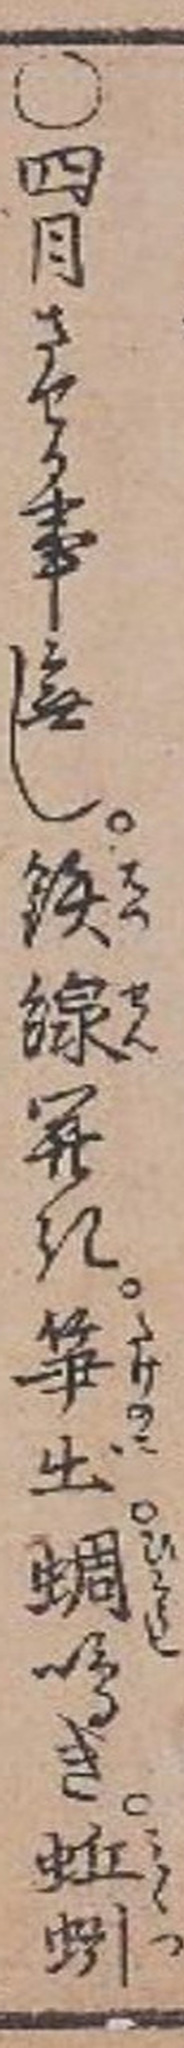○四月させる事無し、鉄線開き、笋出、蜩鳴き、蚯蚓
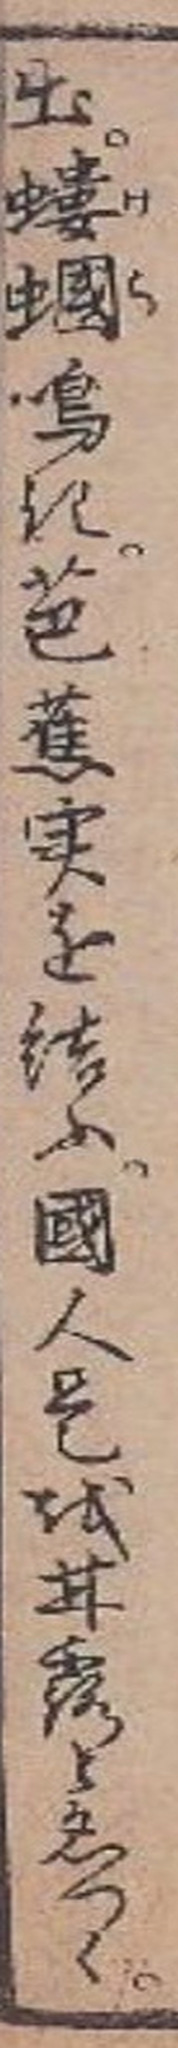出、螻蟈鳴き、芭蕉実を結ふ、国人是を甘露と名つく、
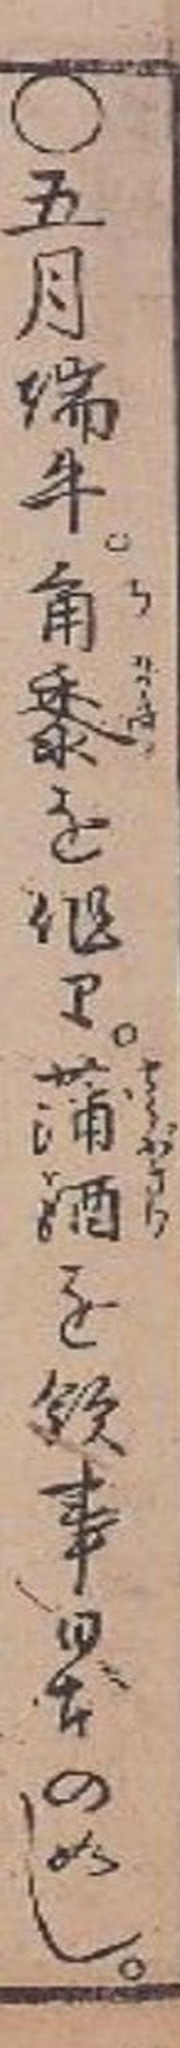○五月端午、角黍を作り、蒲酒を飲事日本の如し、
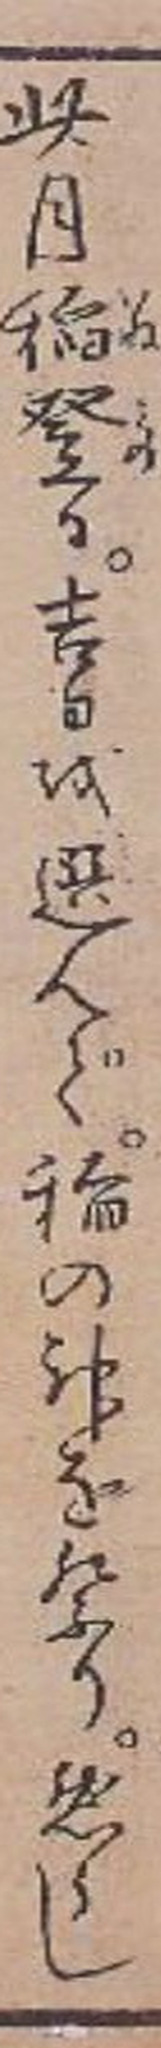此月稲登る、吉日を選んで、稲の神を祭り、然うし
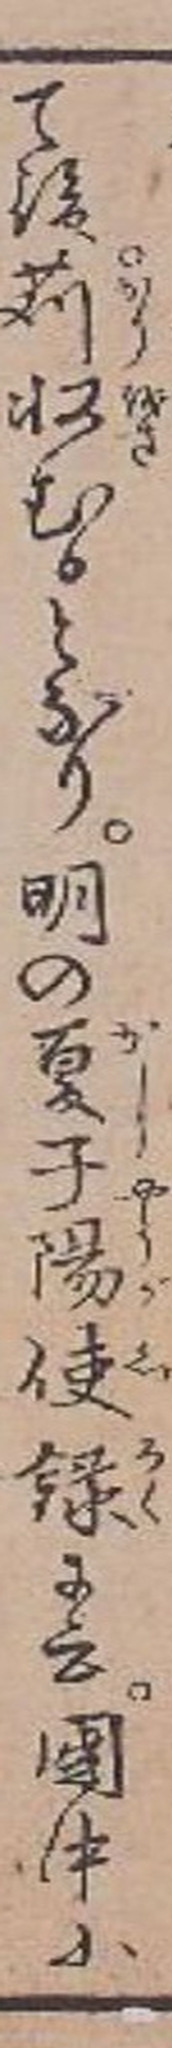て後、苅収むるとなり、明の夏子陽使録に云、国中に
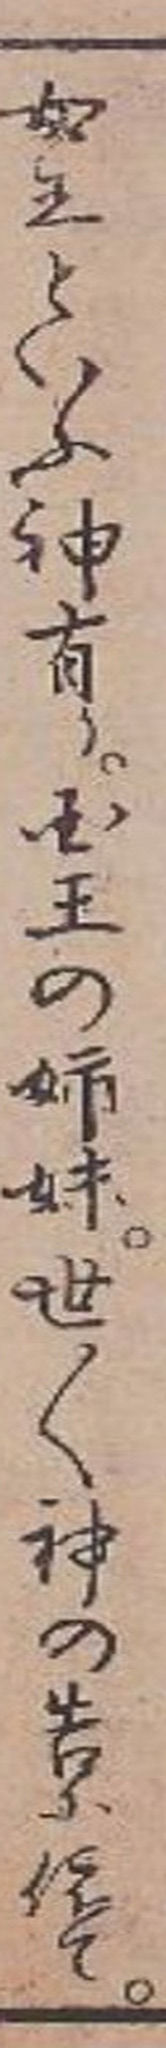女王といふ神有り、国王の姉妹、世〳〵神の告に依て、
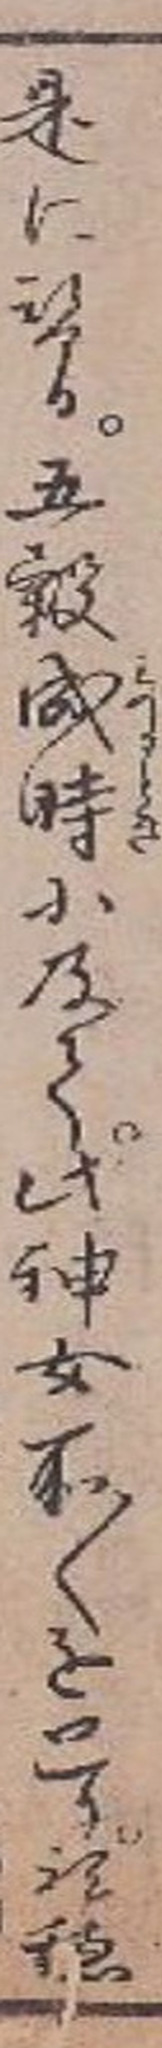是に替る、五穀成時に及て、此神女所〳〵を廻り、穂
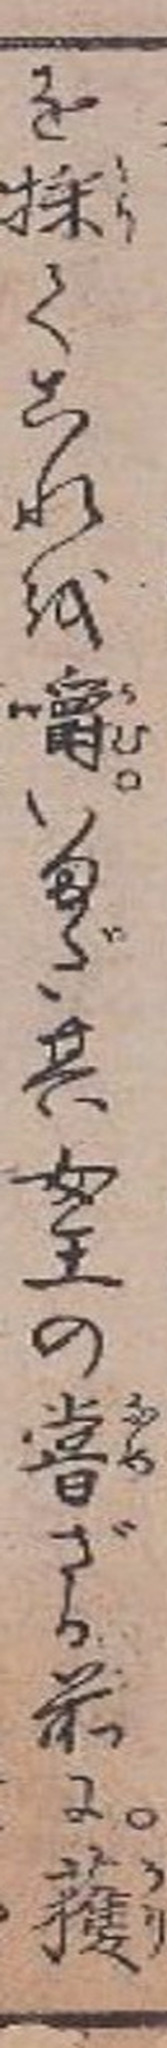を採てこれを嚼、いまだ其女王の甞ざる前に、獲
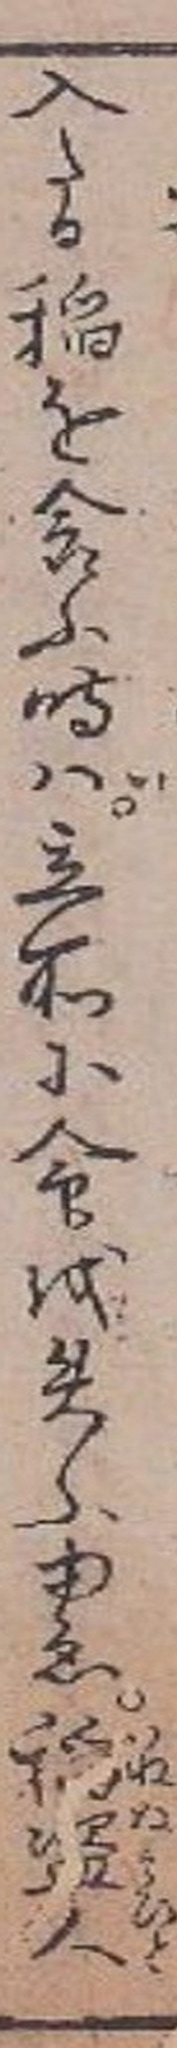入たる稲を食ふ時は、立所に命を失ふゆゑ、稲盗人
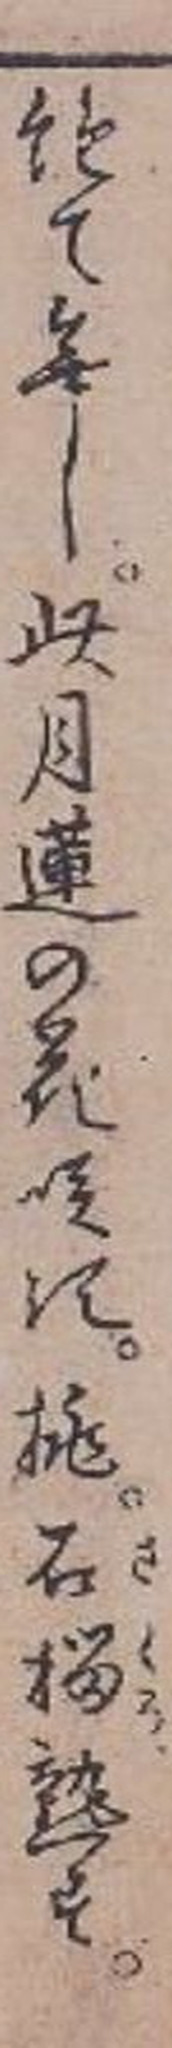絶て無し、此月蓮の花咲き、桃、石榴熟す、
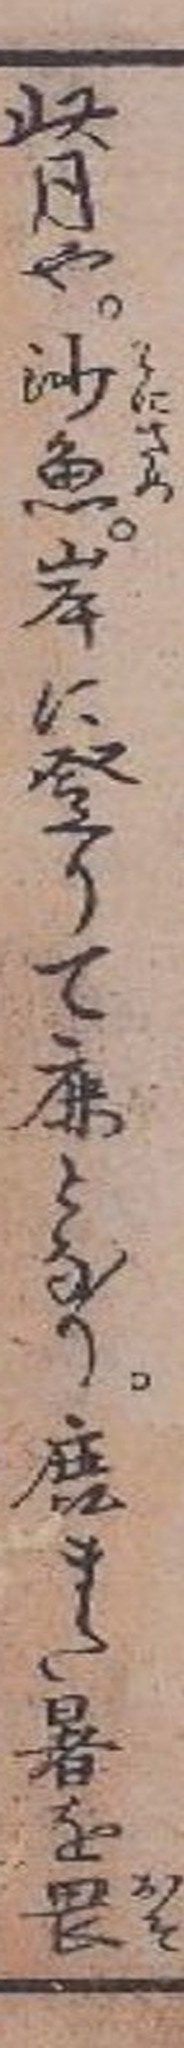此月や、沙魚、岸に登りて鹿となり、鹿また暑を畏

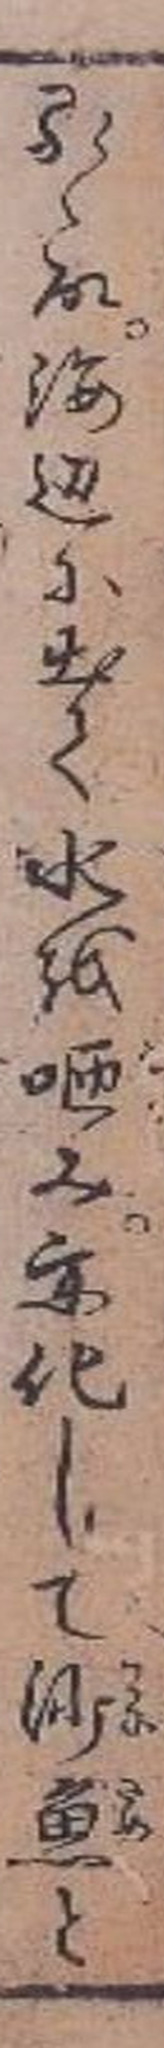るゝ故、海辺に出て水を咂み、亦化して沙魚と
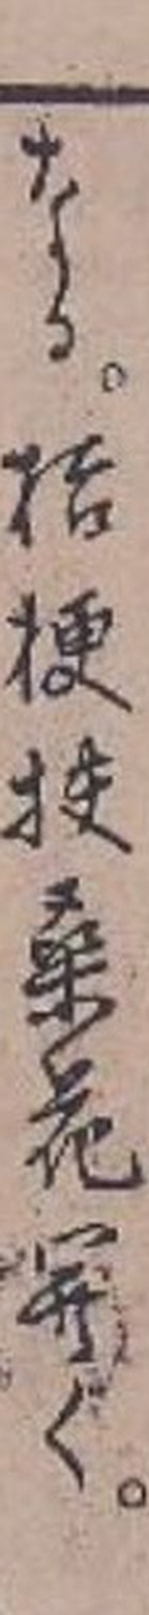なる、桔梗扶桑花開く、
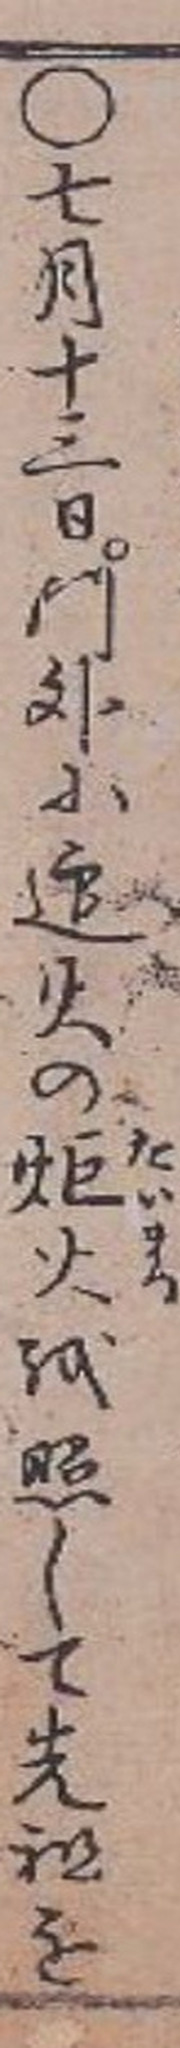○七月十三日、門外に迎火の炬火を照して先祖を
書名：琉球談
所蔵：University of the Ryukyus Library
